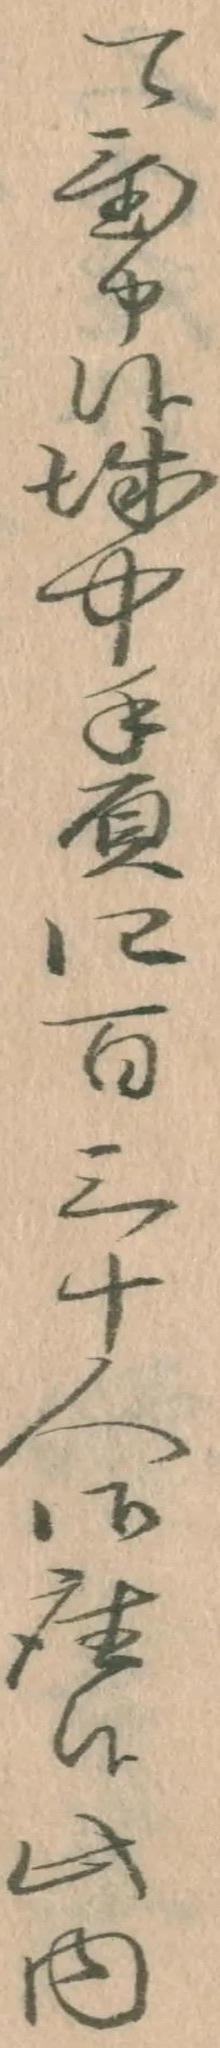て置申候城中手負四百三十人御座候此内
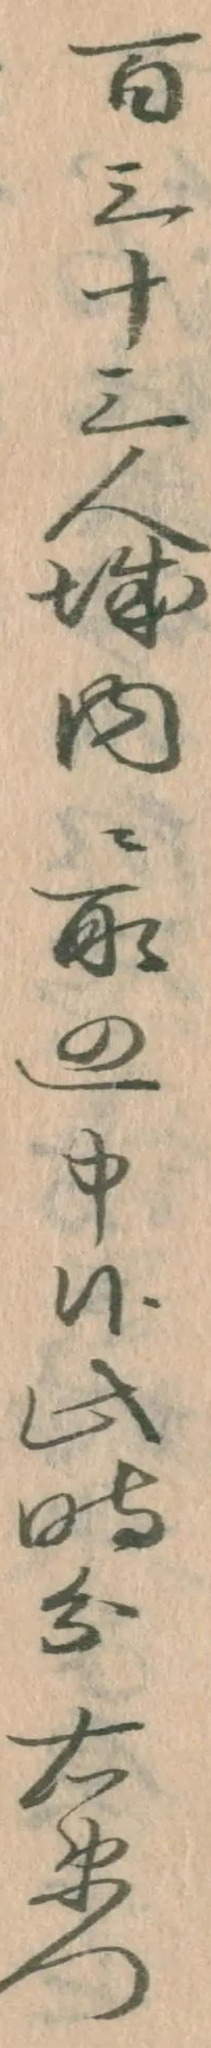百三十三人城内に取込申候此時分右衛門
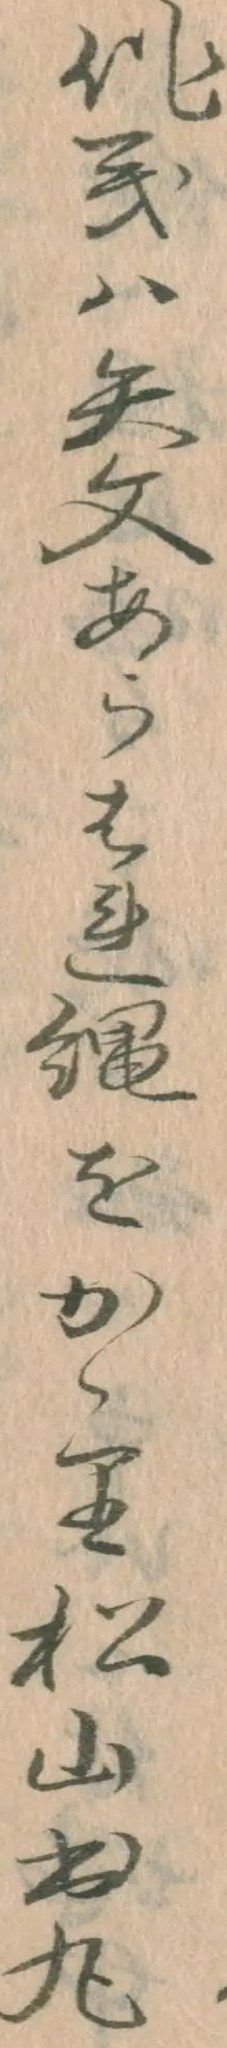作義は矢文あら者連縄をかゝ里松山出丸
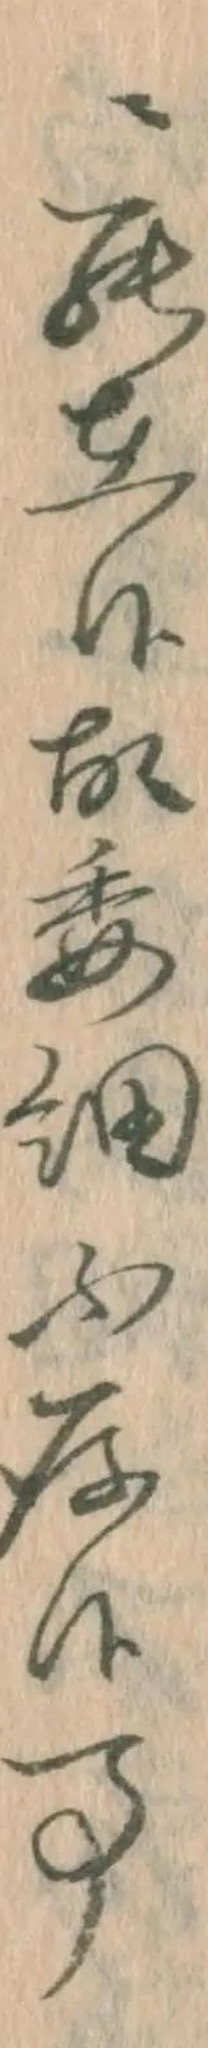に罷在候故委細ふ存候事
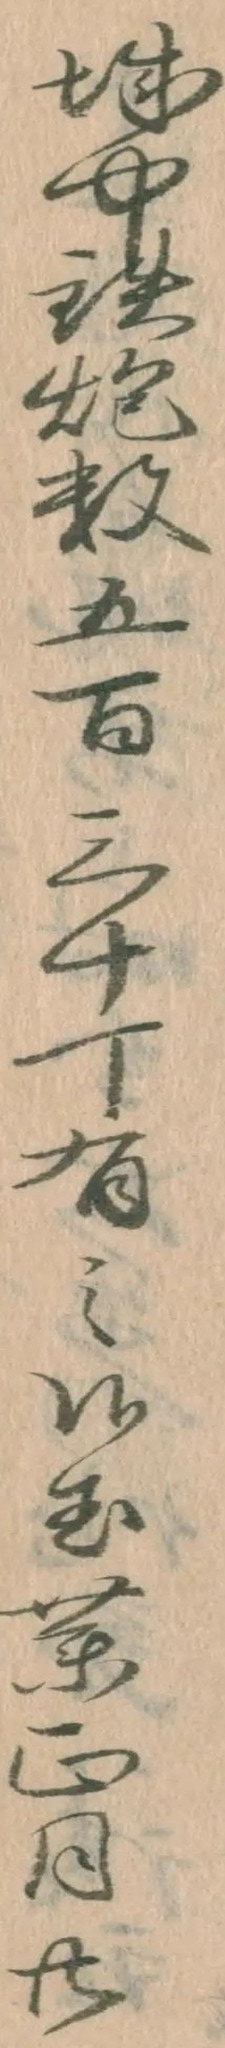一城中鉄砲数五百三十丁有之候玉薬正月廿
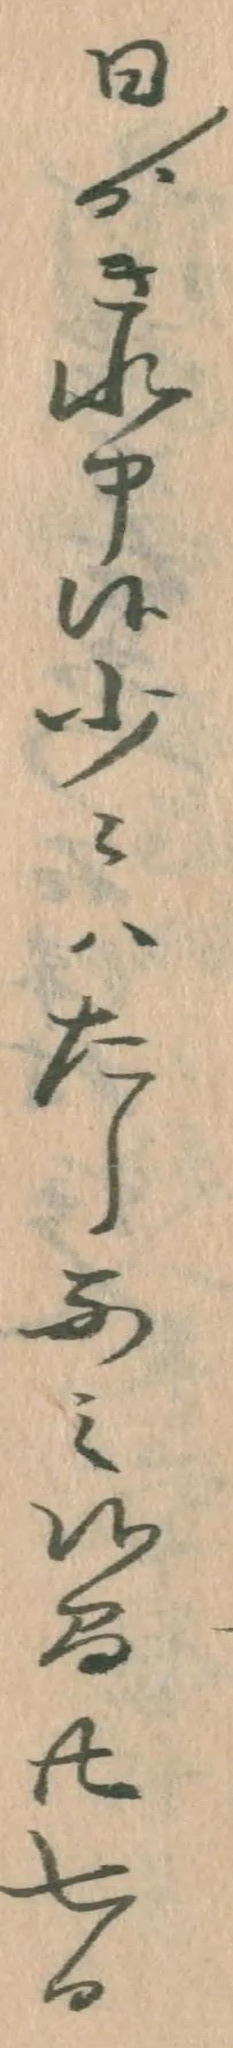日ゟきれ申候少々はたしなみ候間廿七日
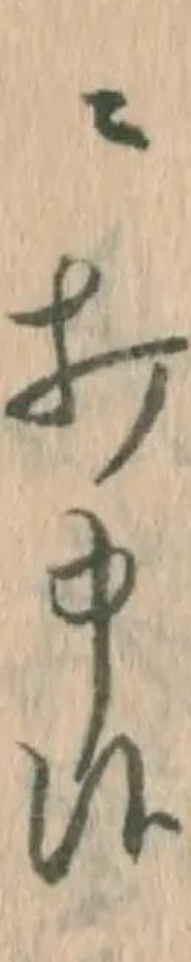に打申候
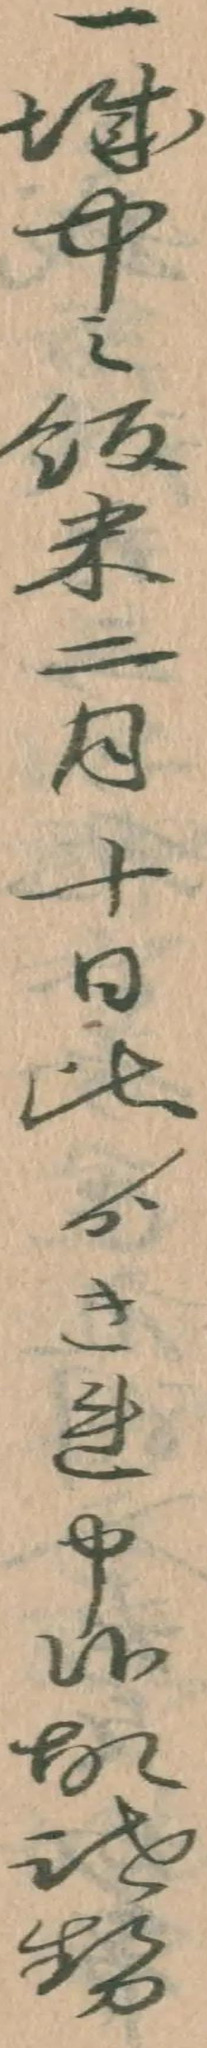一城中之飯米二月十日比ゟき連申候故諸勢
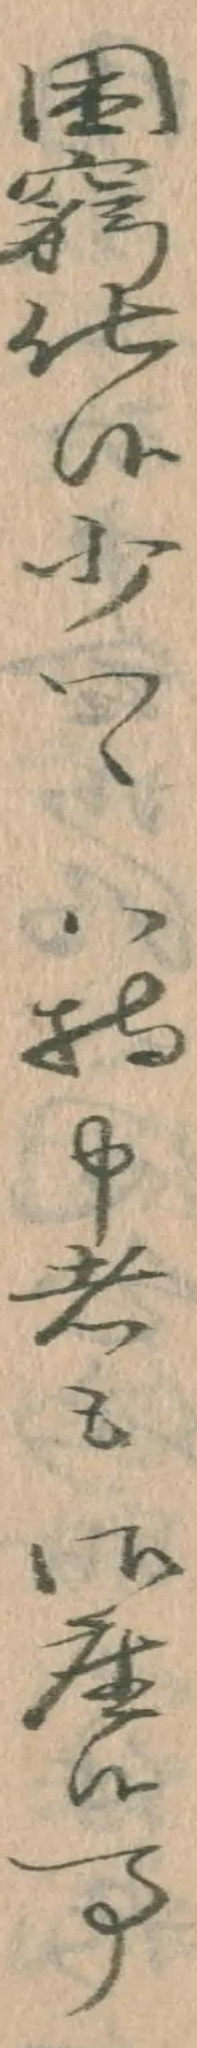困窮仕候少つゝは持申者も御座候事
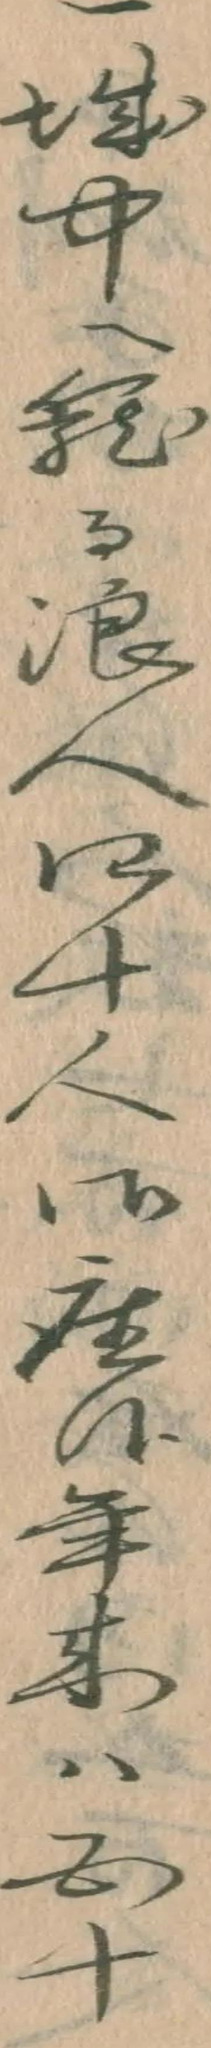一城中へ籠る浪人四十人御座候年来は五十
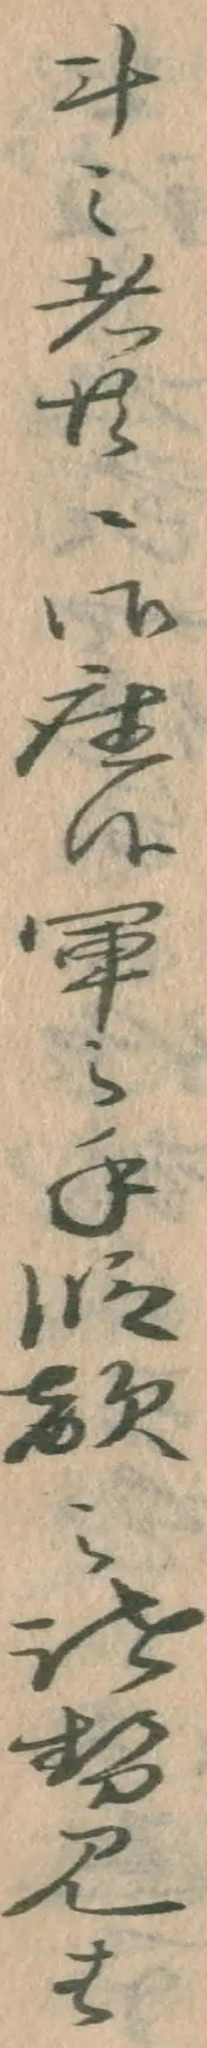斗之者共に御座候軍之手段敵之諸勢見者
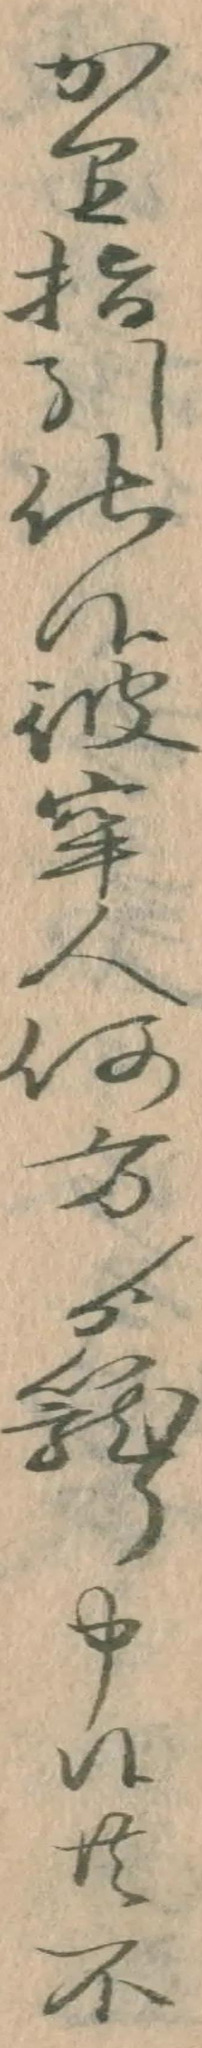か里指引仕候彼牢人何方ゟ籠り申候共不
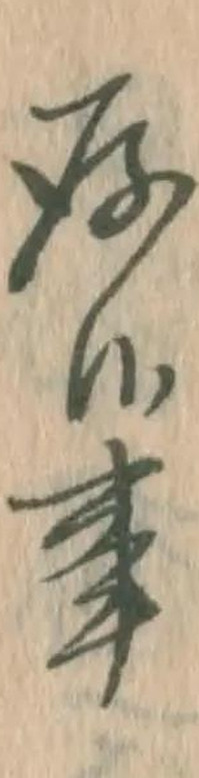存候事
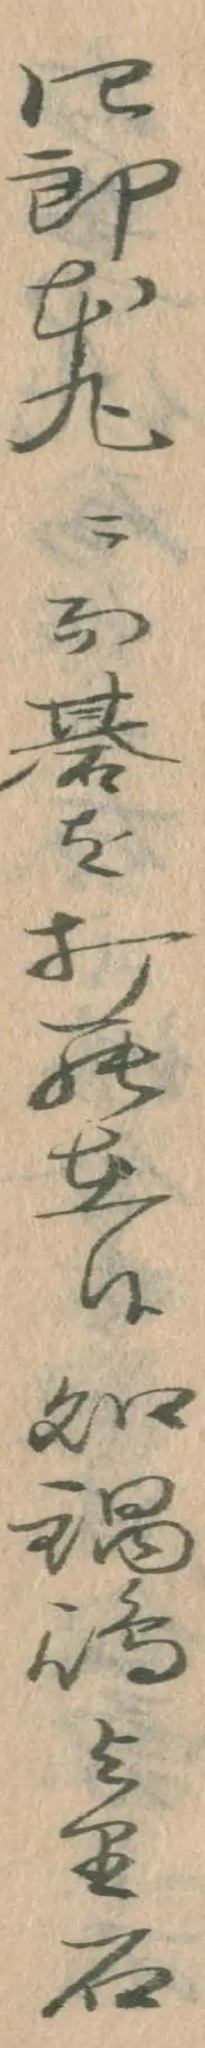一四郎本丸に而碁を打罷在候処鍋島与里石
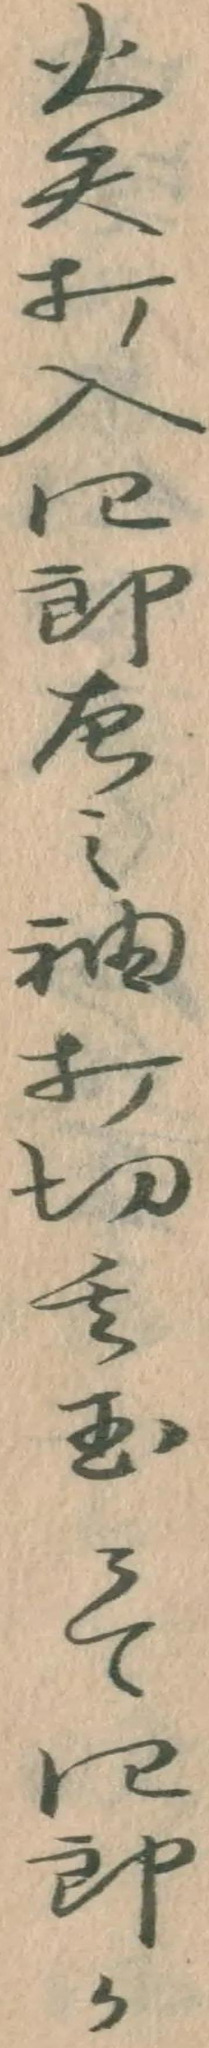火矢打入四郎左之袖打切其玉にて四郎か
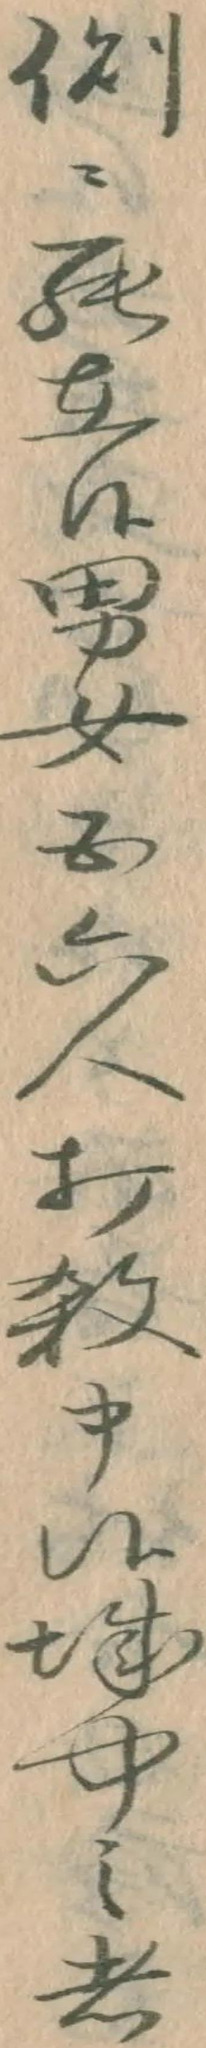倒に罷在候男女五六人打殺申候城中之者
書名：切支丹御退治記 49巻. [9]
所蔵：国立国会図書館 National Diet Library, JAPAN
